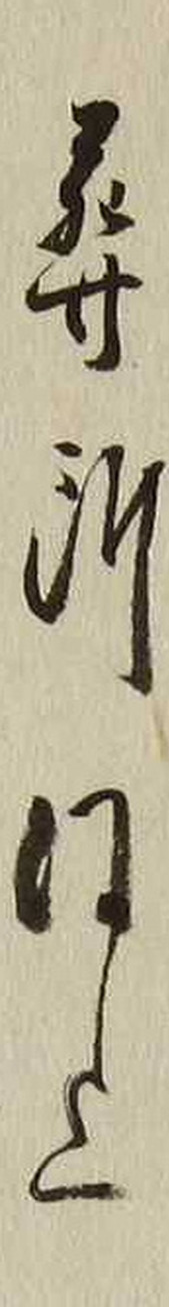葬所同上
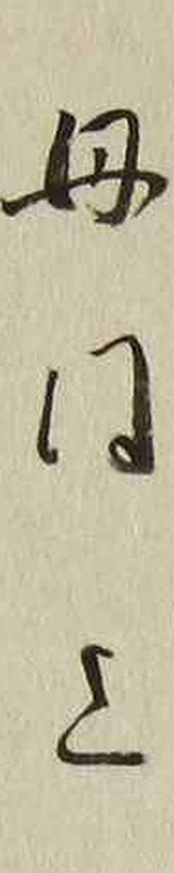母同上
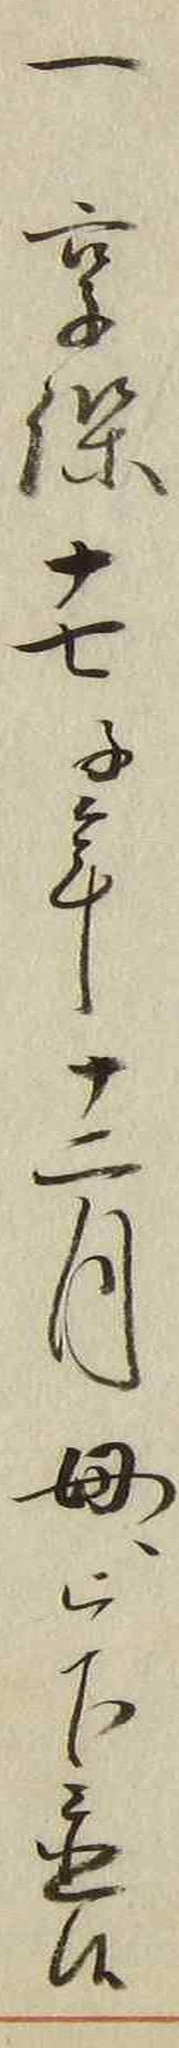一享保十七子年十二月母へ被下置候

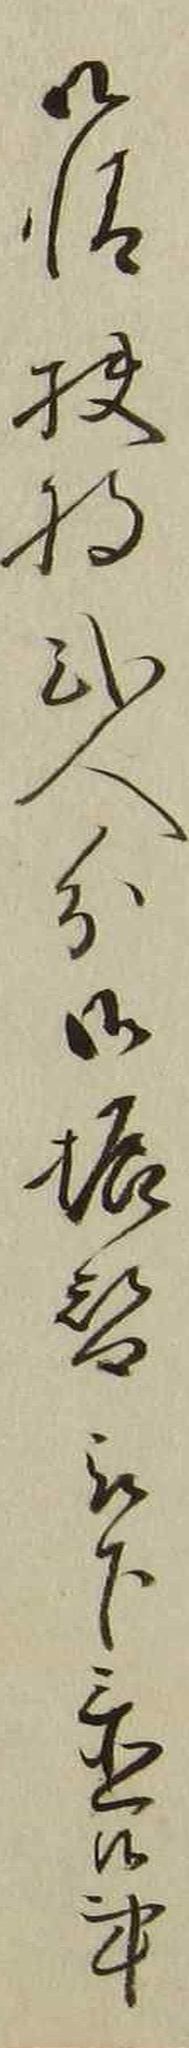御情扶持弐人分御振替被下置候事
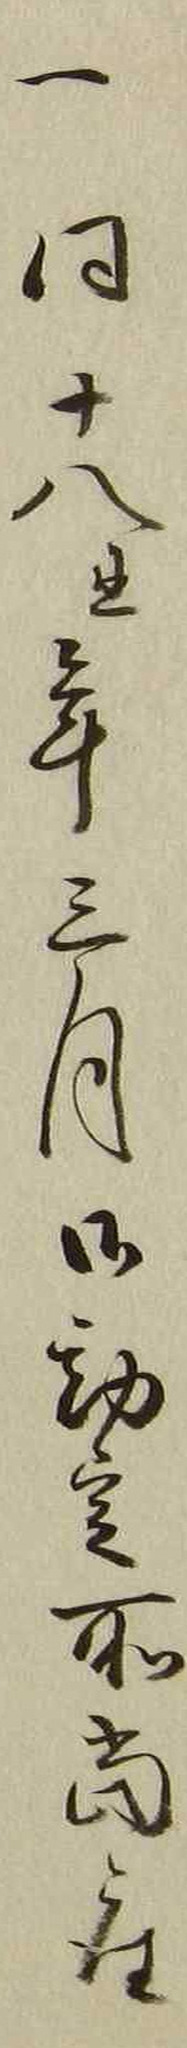一同十八丑年三月御勘定所当座
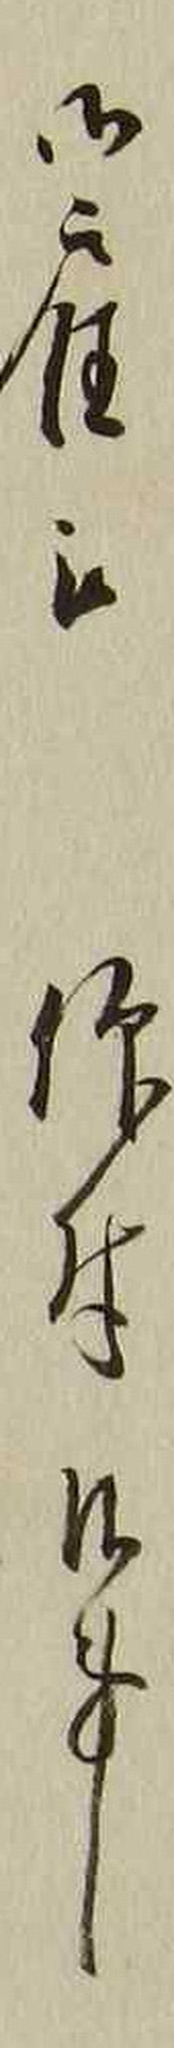御雇被仰付候事
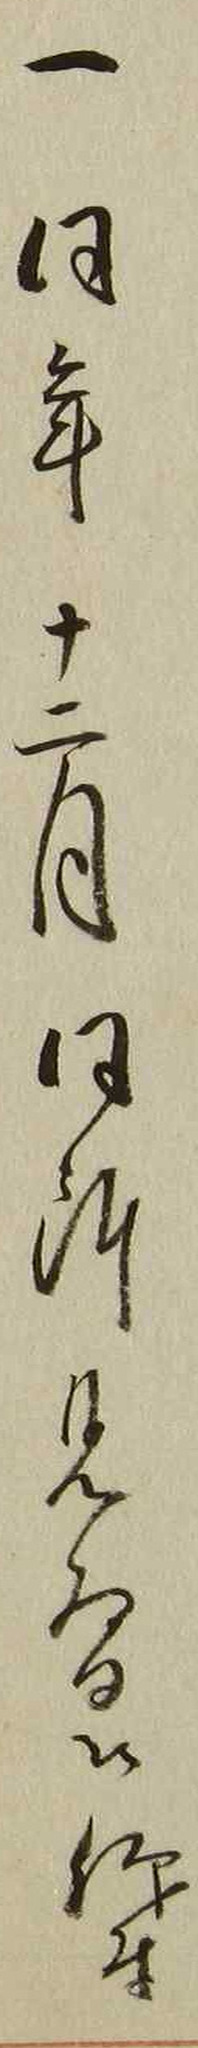一同年十二月同所見習被仰付
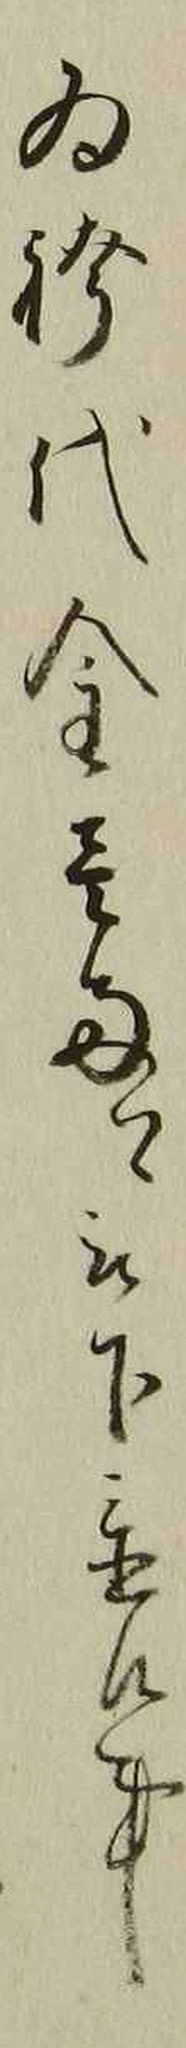為袴代金壱両つゝ被下置候事
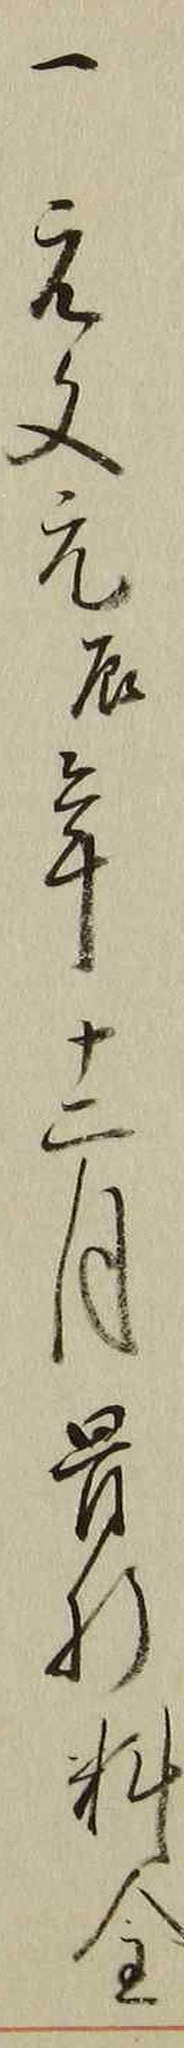一元文元辰年十二月骨折料金
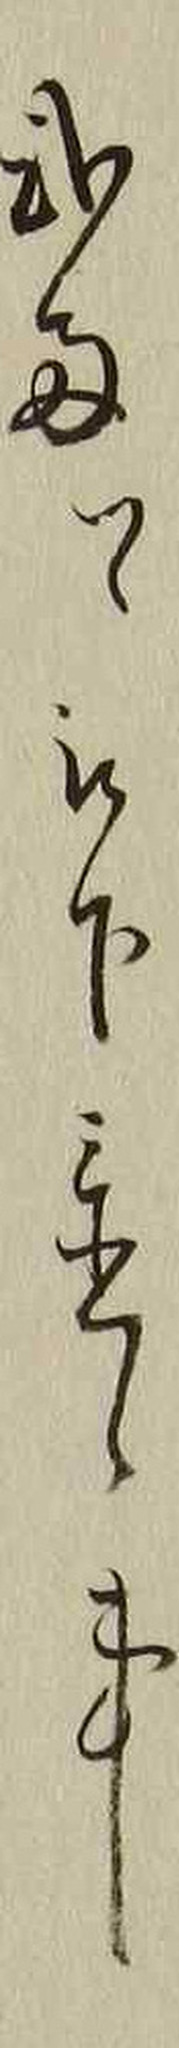弐両つゝ被下置候事
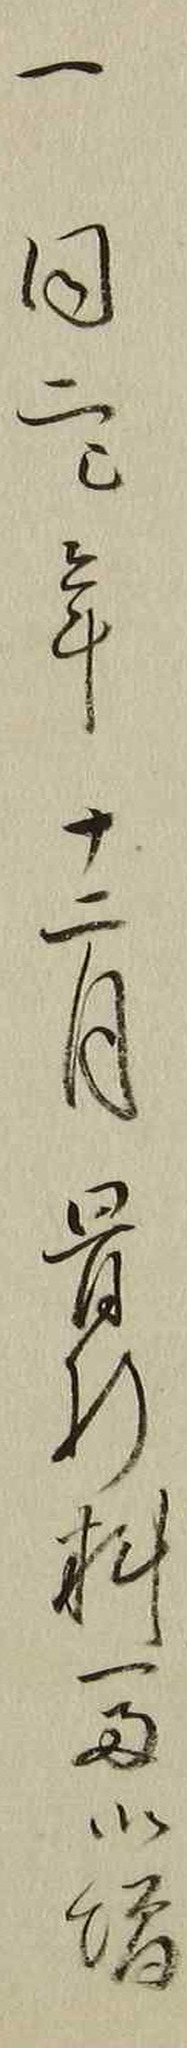一同二巳年十二月骨折料一両御増
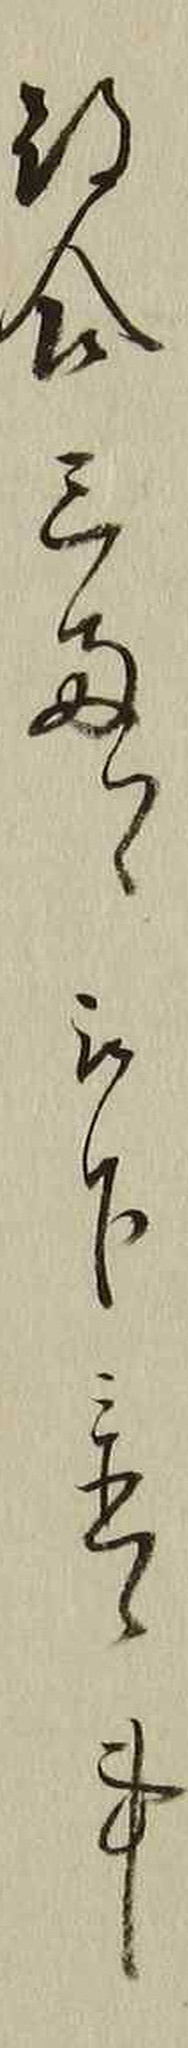役合三両つゝ被下置候事
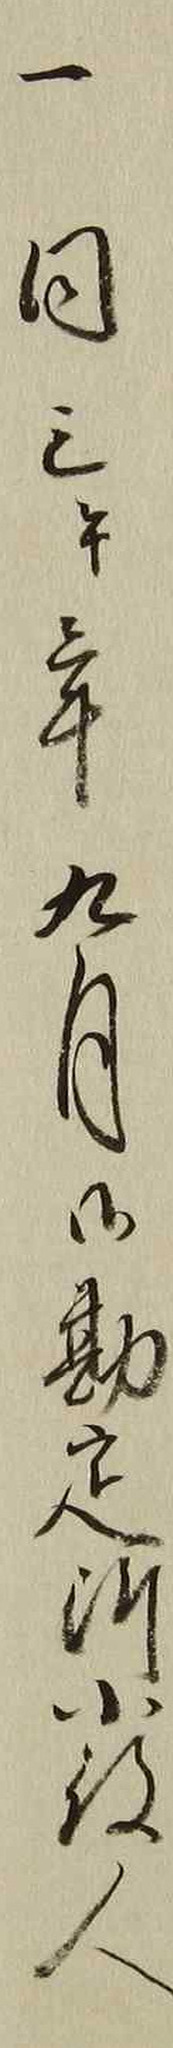一同三午年九月御勘定所小役人
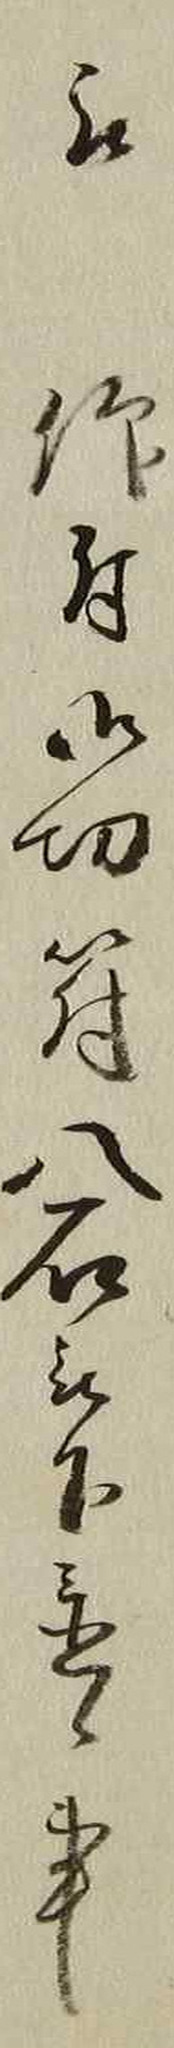被仰付御切符八石被下置候事
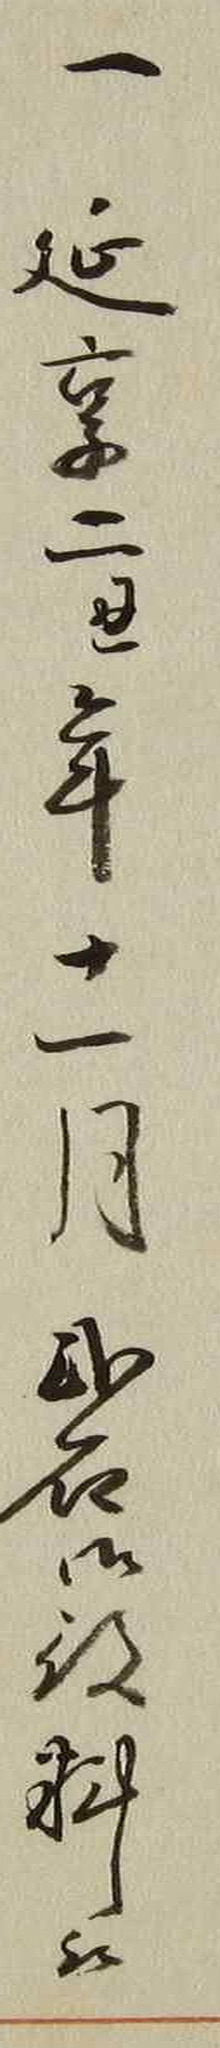一延享二丑年十一月弐石御役料被
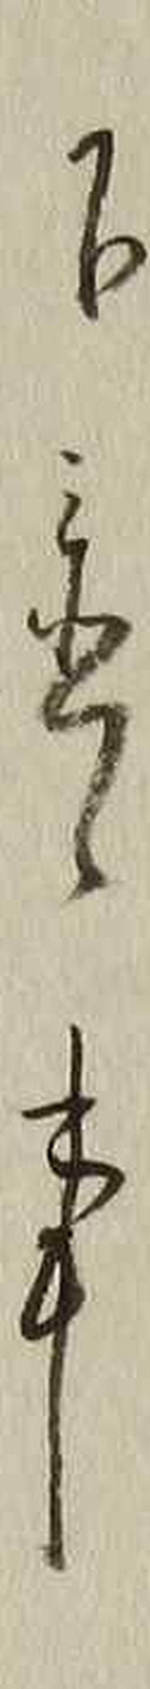下置候事
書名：諸士系譜　巻之32　い之部32
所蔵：会津若松市立会津図書館
